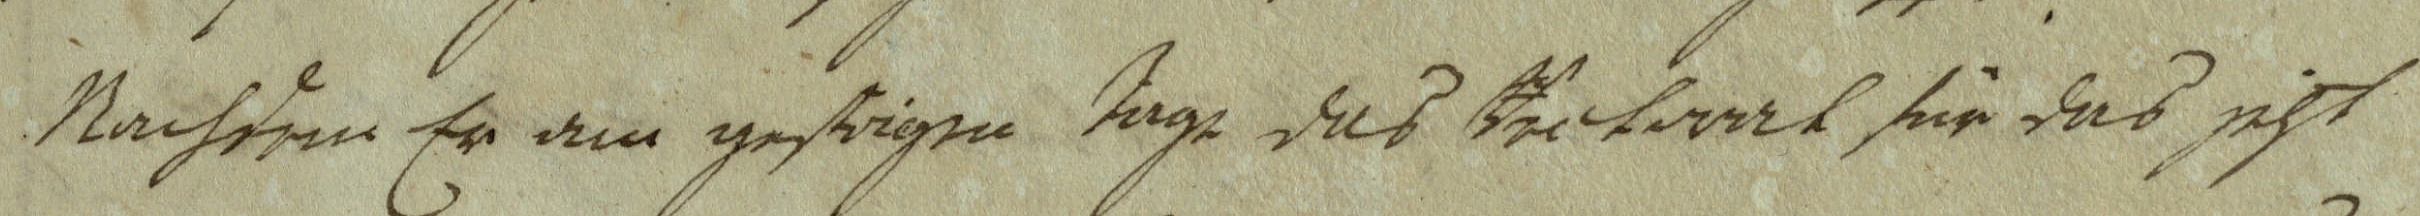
Nachdem Er am gestrigen Tage das Rectorat für das jetzt
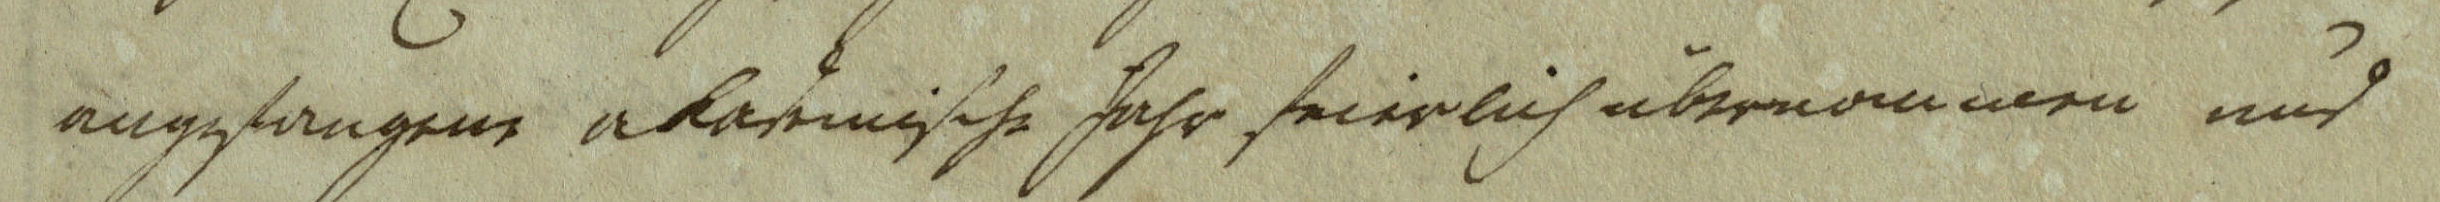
angefangene akademische Jahr feierlich übernommen und
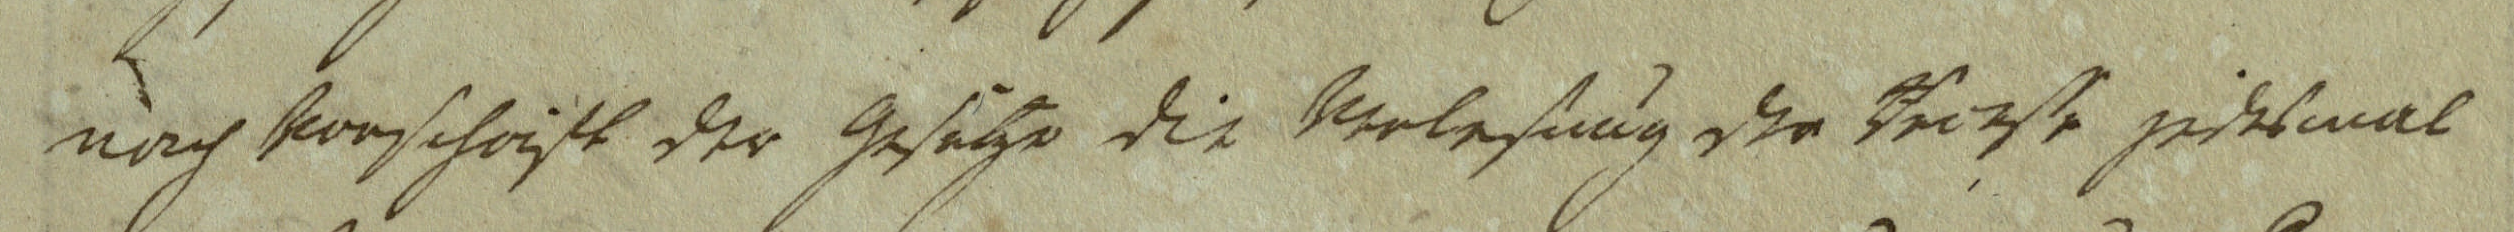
nach Vorschrift der Gesetze die Verlesung der Recese jedesmal
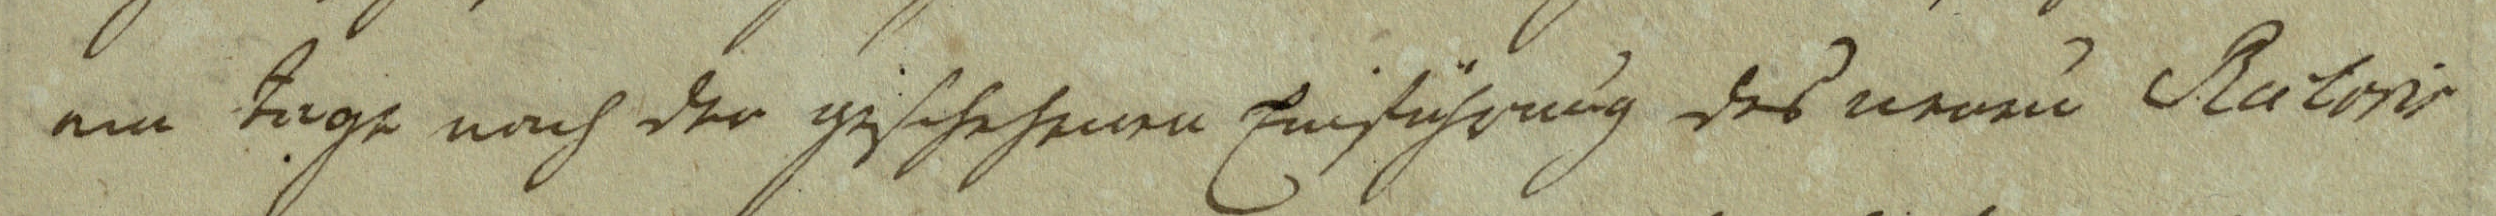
am Tage nach der geschehenen Einführung des neuen Rectori
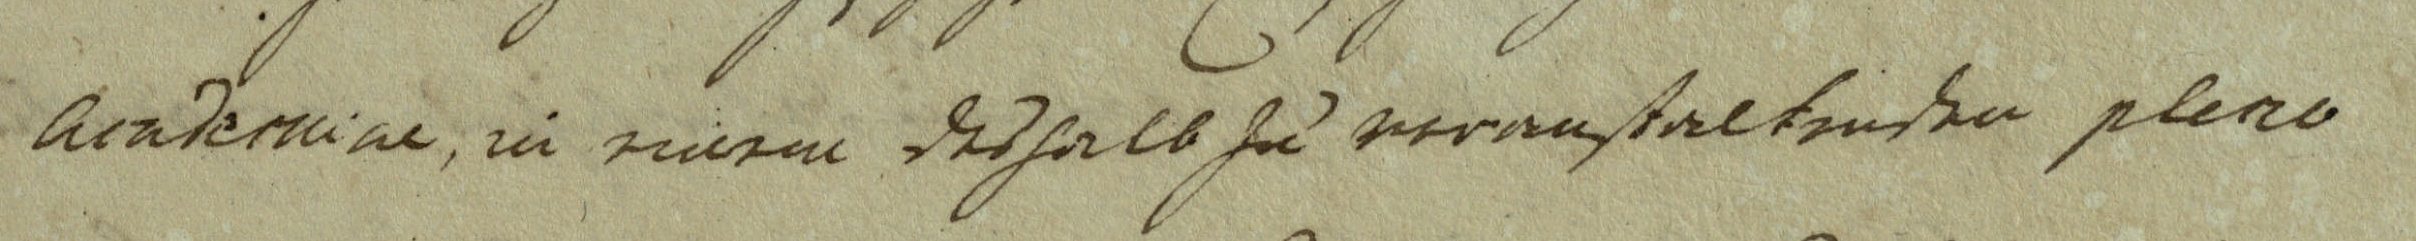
Academiae, in einem deshalb zu veranstaltenden pleno
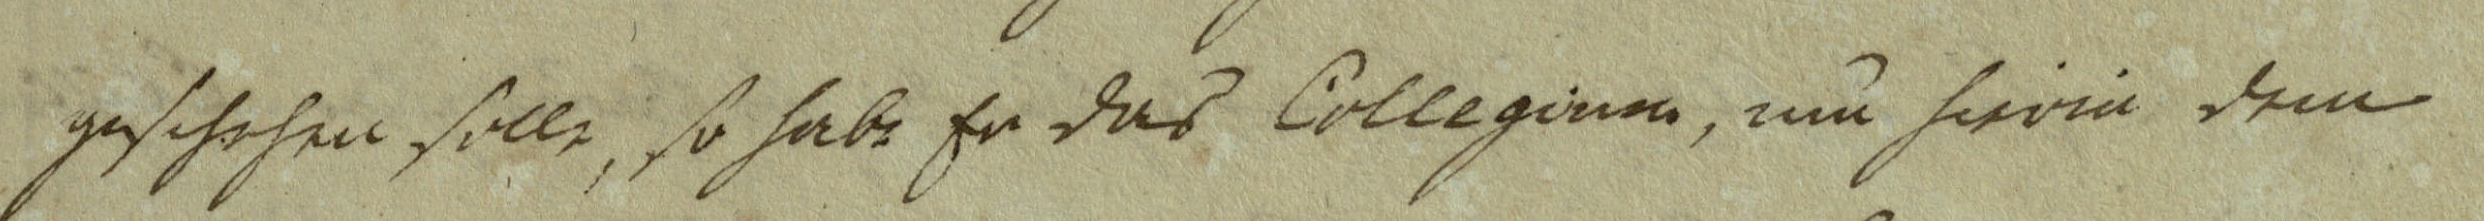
geschehen solle, so habe Er das Collegium, um hierin dem
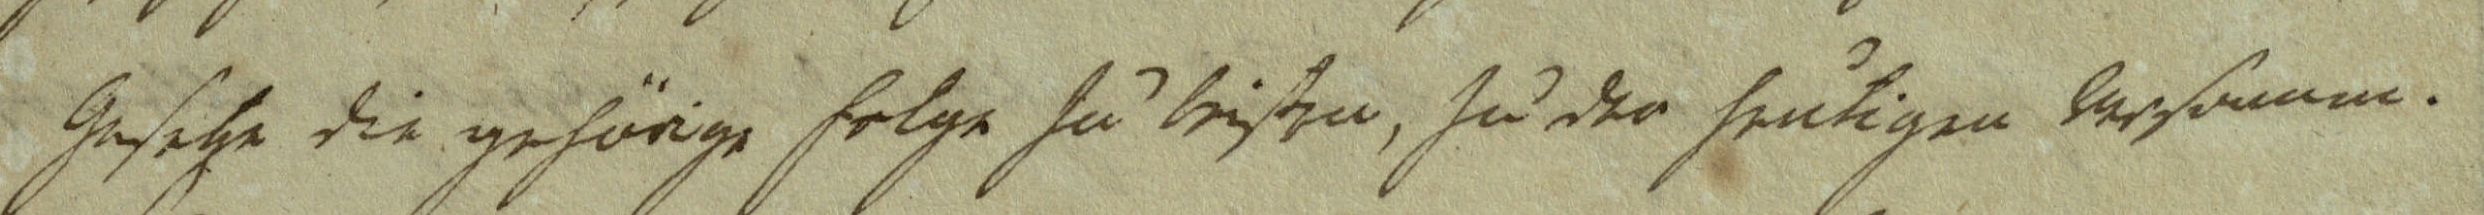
Gesetze die gehörige Folge zu leisten, zu der heutigen Versamm¬
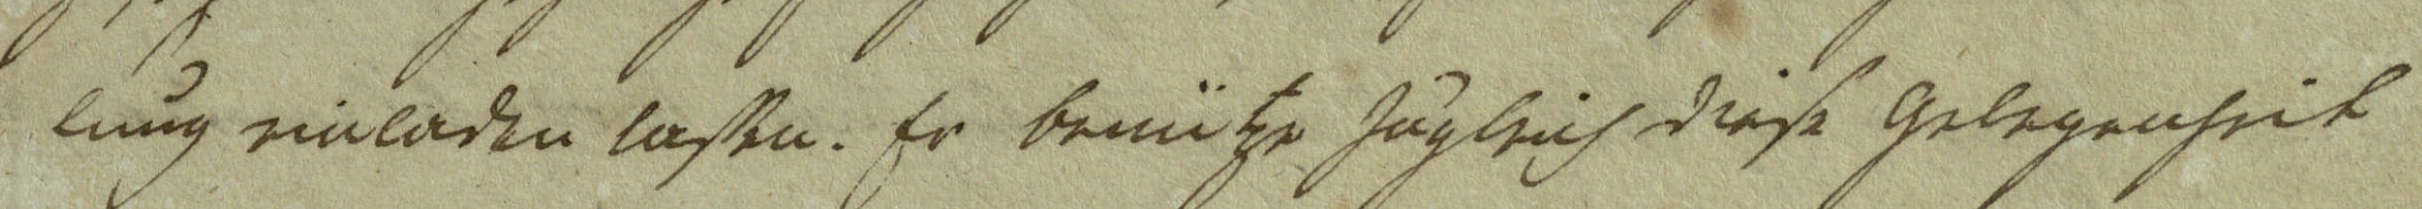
lung einladen lassen. Er benütze zugleich diese Gelegenheit
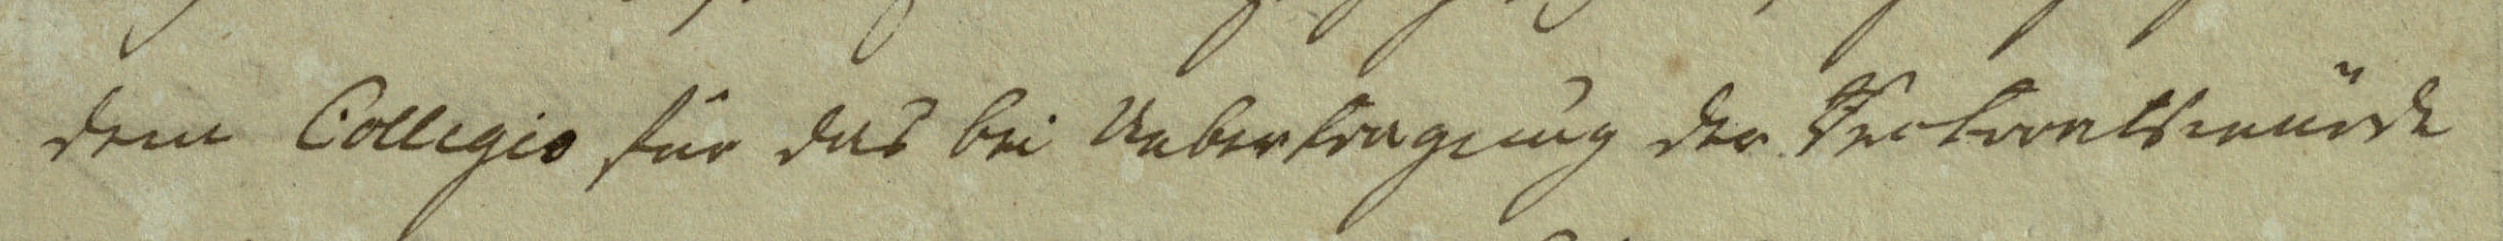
dem Collegio für das bei Uebertragung der Rectoratswürde
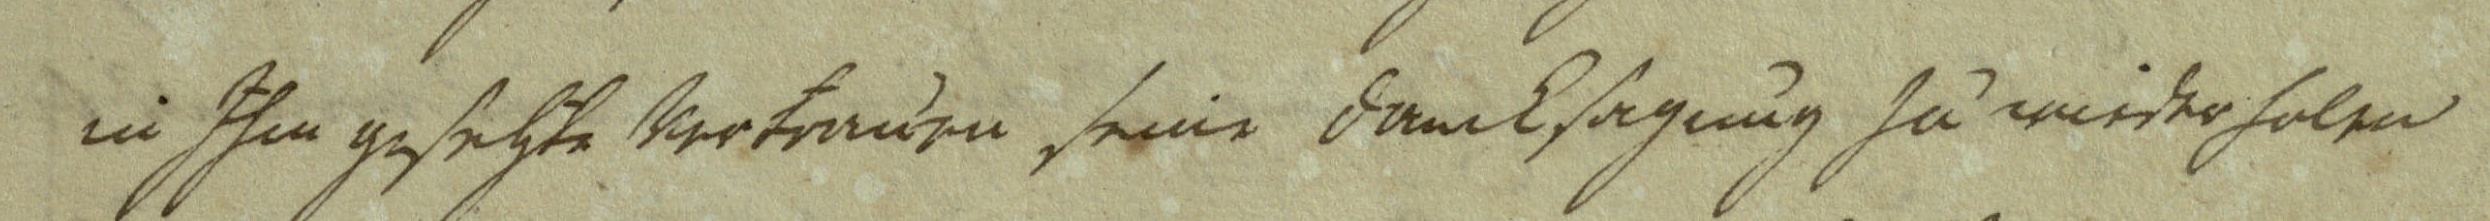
in Ihm gesetzte Vertrauen seine Dancksagung zu wiederholen
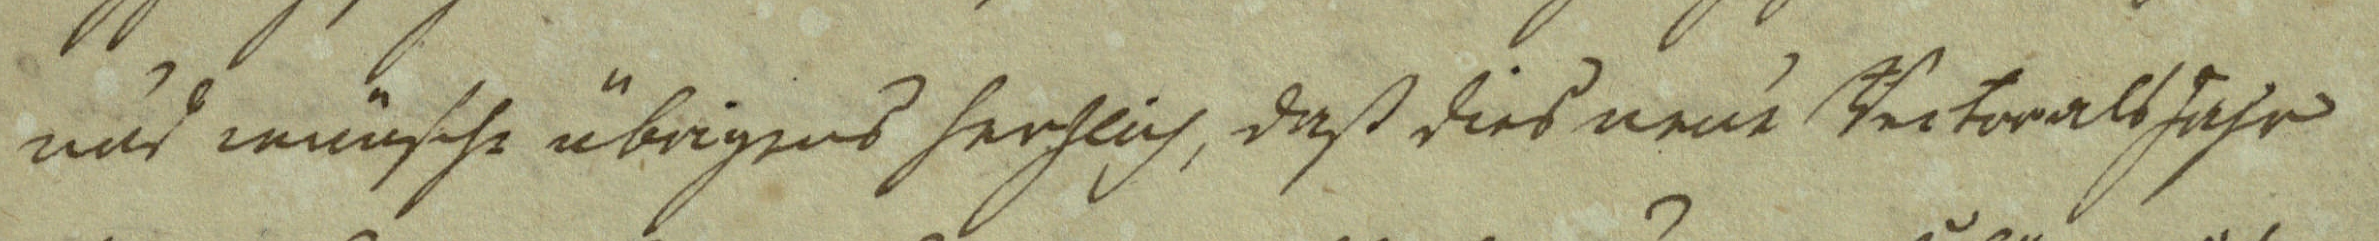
und wünsche übrigens herzlich, daß dies neue RectoratsJahr
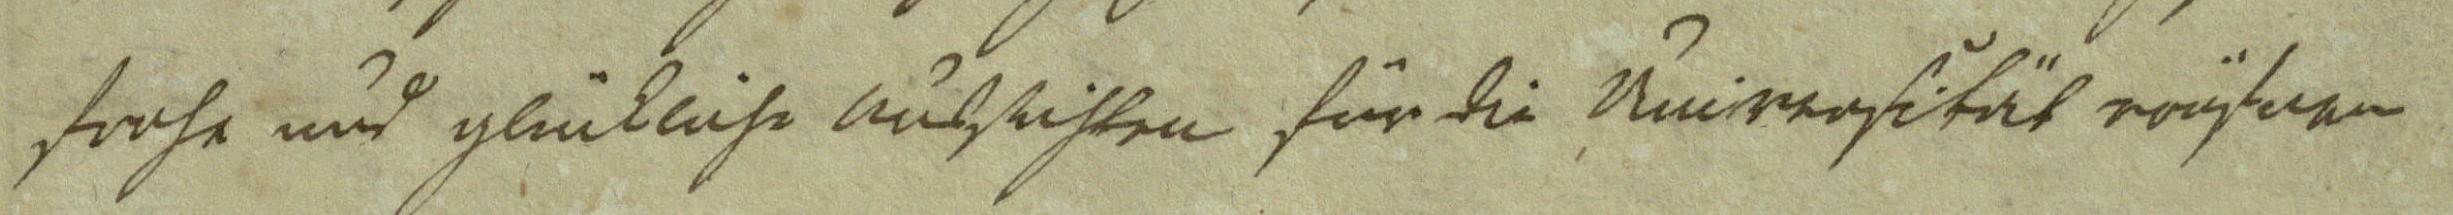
frohe und glückliche Aussichten für die Universität eröfnen
